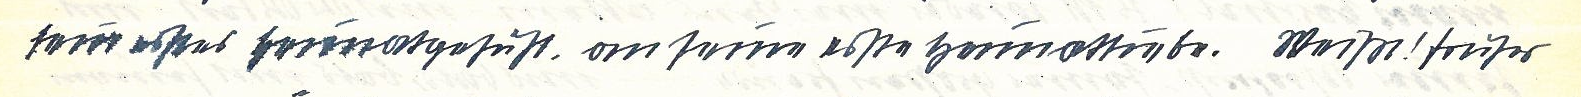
sein erstes Heimatgefühl, an seine erste Heimatliebe: Weißt früher
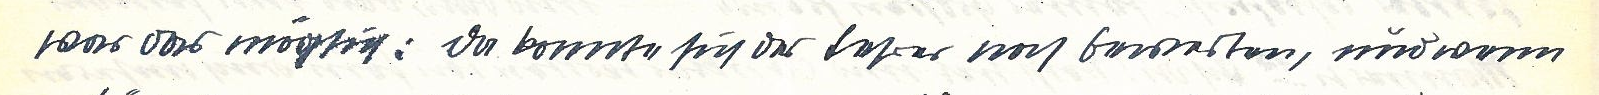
war das möglich da konnte der Lehrer sich noch bewerben, und wenn
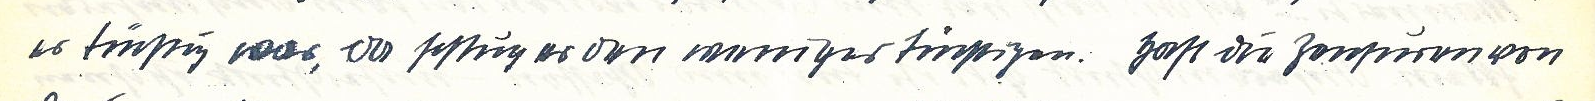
er tüchtig war, da schlug er den weniger Tüchtigen. Hast die Zensuren von
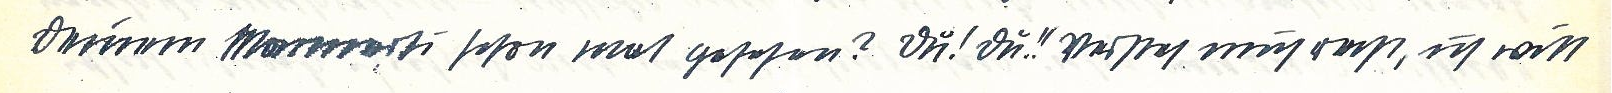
Deinem Mannerli schon mal gesehen? Du! Du!! Versteh mich recht, ich will
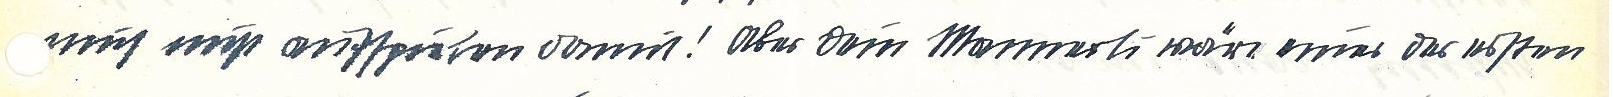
mich nicht aufspielen damit! Aber Dein Mannerli wäre einer der ersten
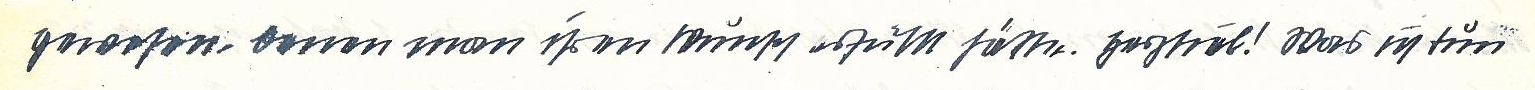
gewesen, denen man ihren Wunsch erfüllt hätte. Herzlieb! Was ich tun
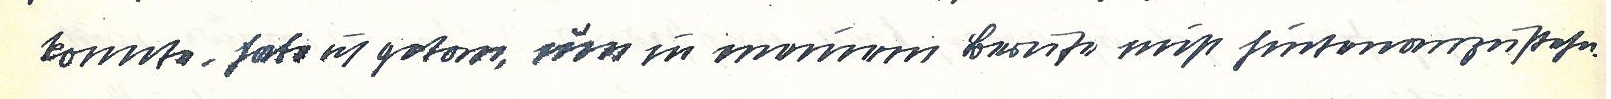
konnte, hab ich getan, um in meinem Berufe nicht hintanzustehen.
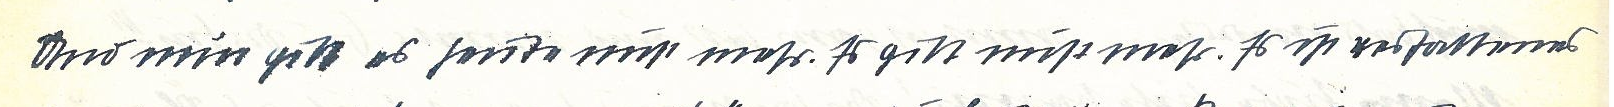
Und nun gilt es heute nicht mehr. Es gilt nicht mehr. Es ist verfallenes
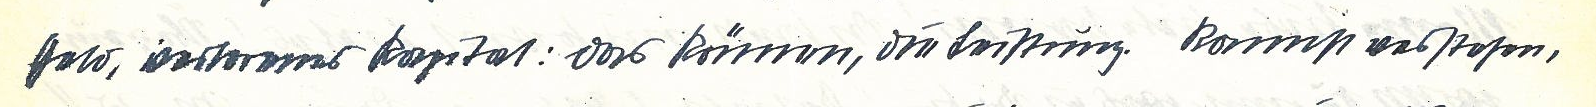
Geld, verlorenes Kapital: das Können, die Leistung. Kannst verstehen,
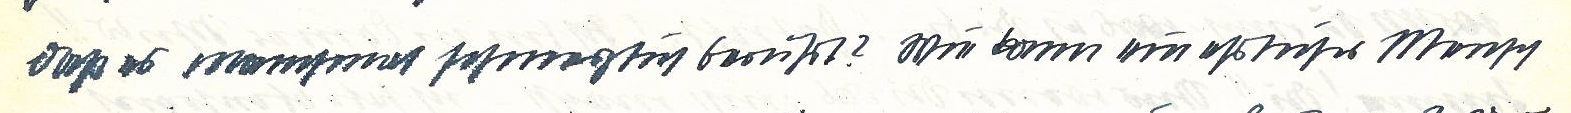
daß es mich manchmal schmerzlich berührt? Wie kann ein ehrlicher Mensch
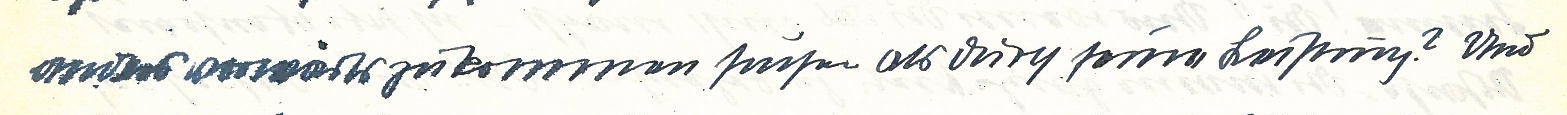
anders vorwärts zu kommen versuchen als durch seine Leistung? Und
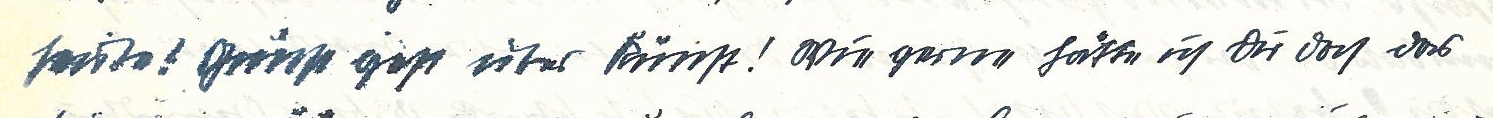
heute? Gunst geht über Kunst! Wie gerne hätte ich Dir doch das
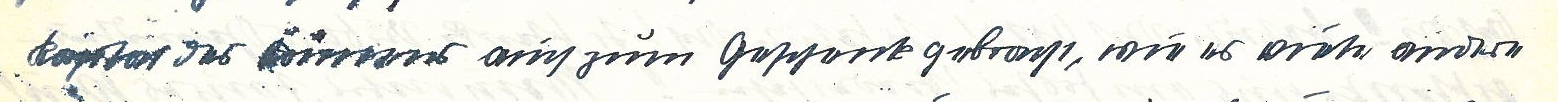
Kapital des Könnens auch zum Geschenk gebracht, wie es viele andere
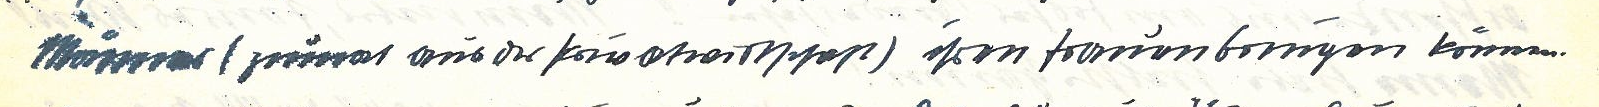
Männer (zumal aus der Privatwirtschaft) ihren Frauen bringen können.
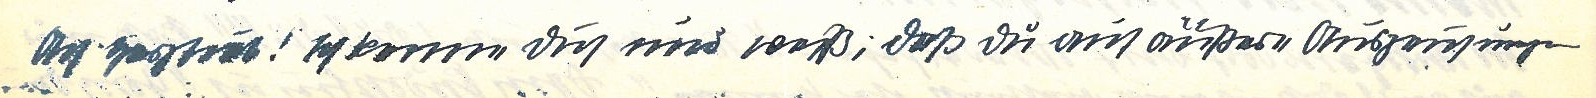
Ach Herzlieb! ich kenne Dich und weiß, daß Du auf äußere Auszeichnungen
